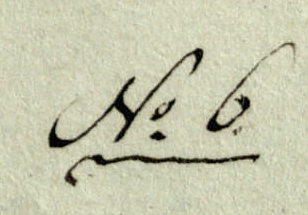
No 6
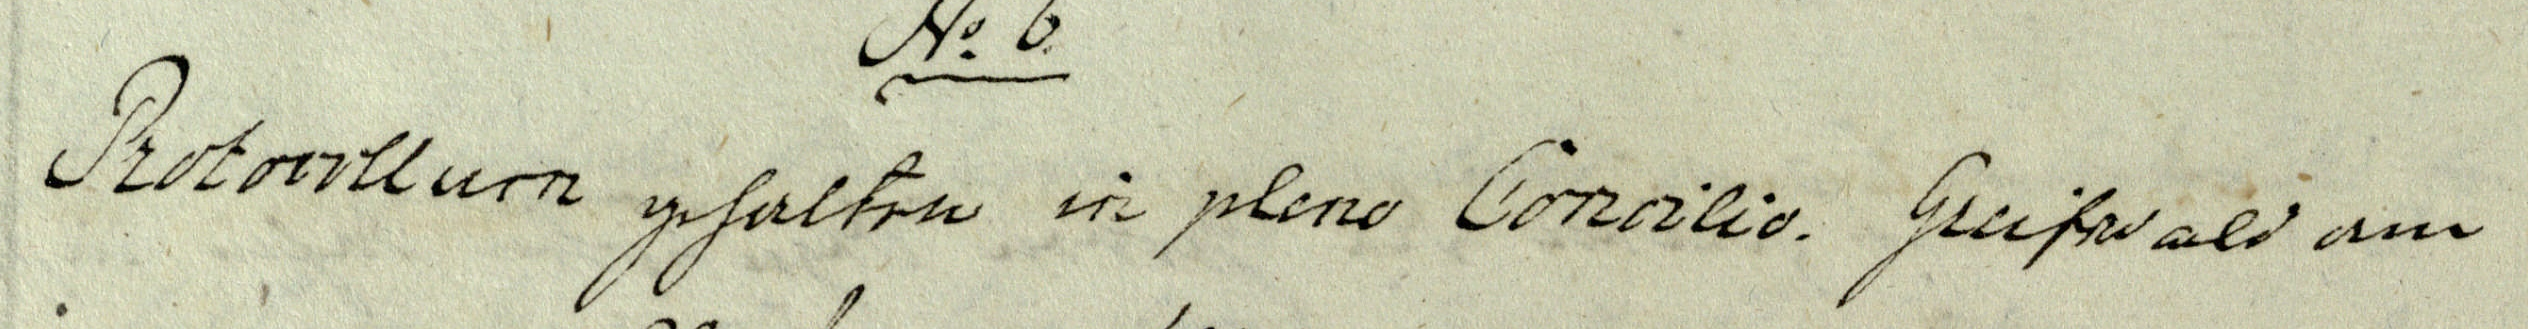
Protocollum gehalten in pleno Concilio. Greifswald am
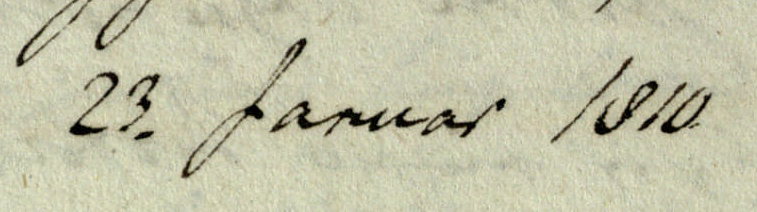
23. Januar 1810
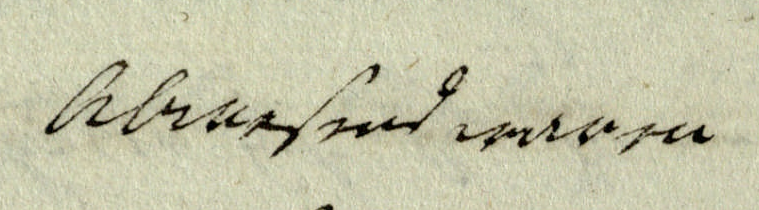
Abwesend waren
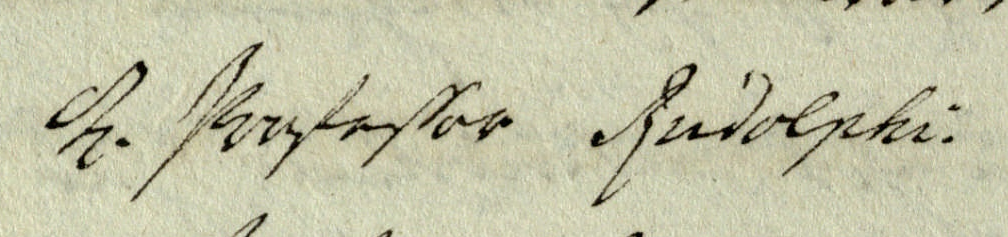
dh. Professor Rudolphi.
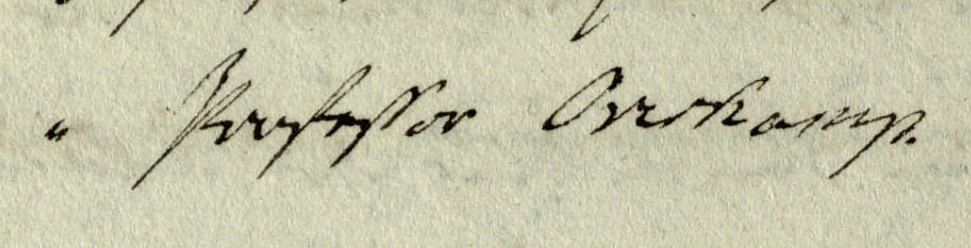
Professor Overkamp.
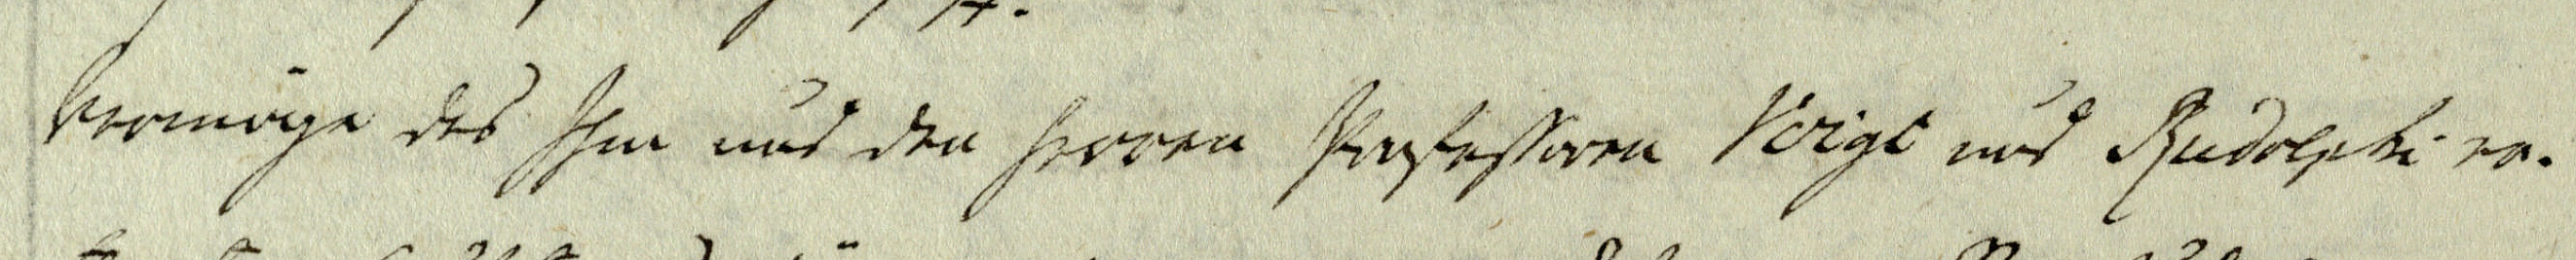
Vermöge des Ihm und den Herren Professoren Voigt und Rudolphi er¬
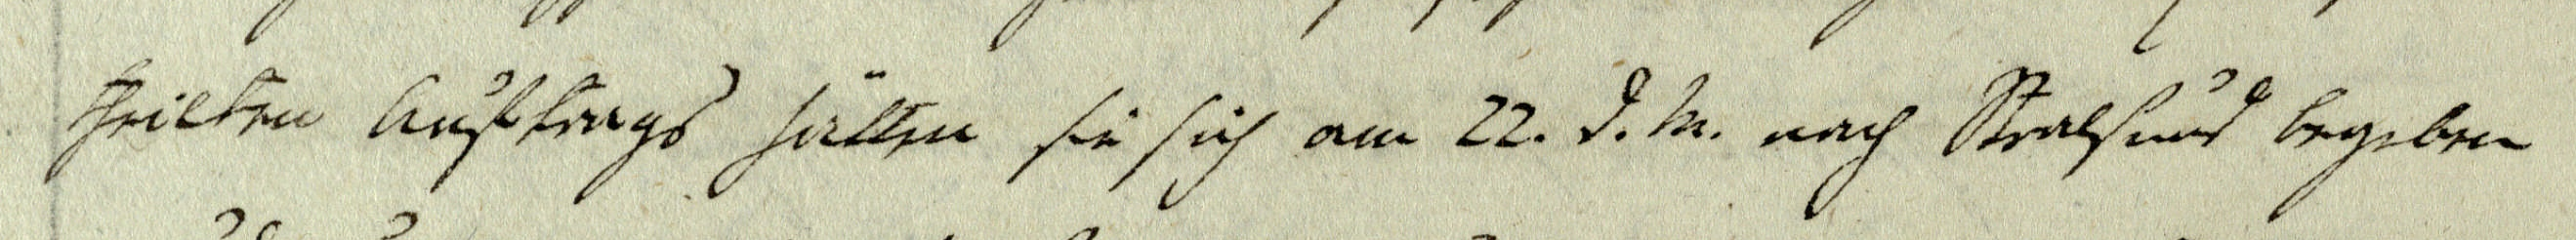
theilten Auftrags hätten sie sich am 22. d. M. nach Stralsund begeben
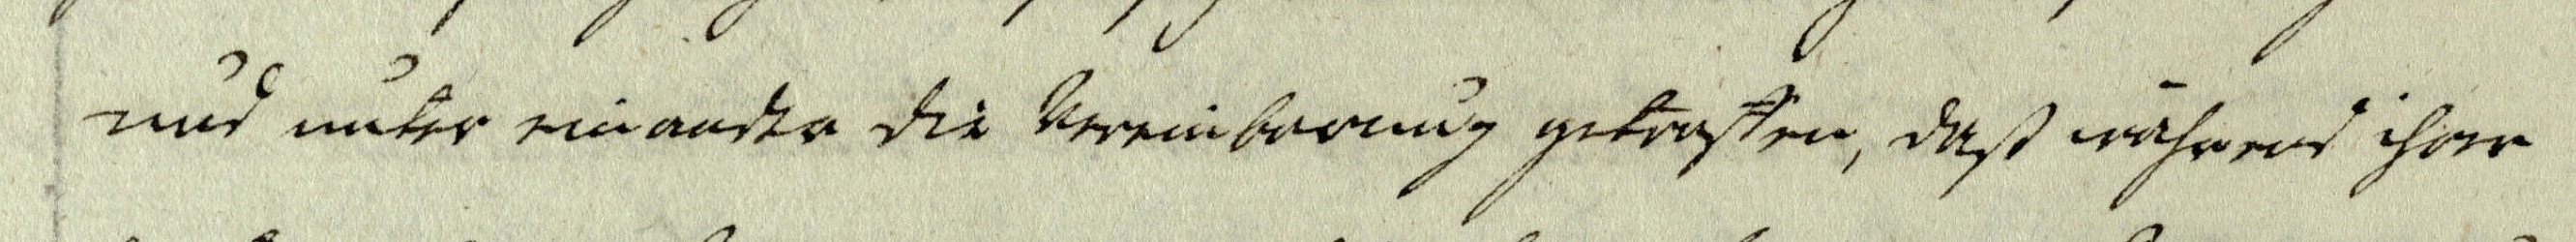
und unter einander die Vereinbarung getroffen, daß während ihrer
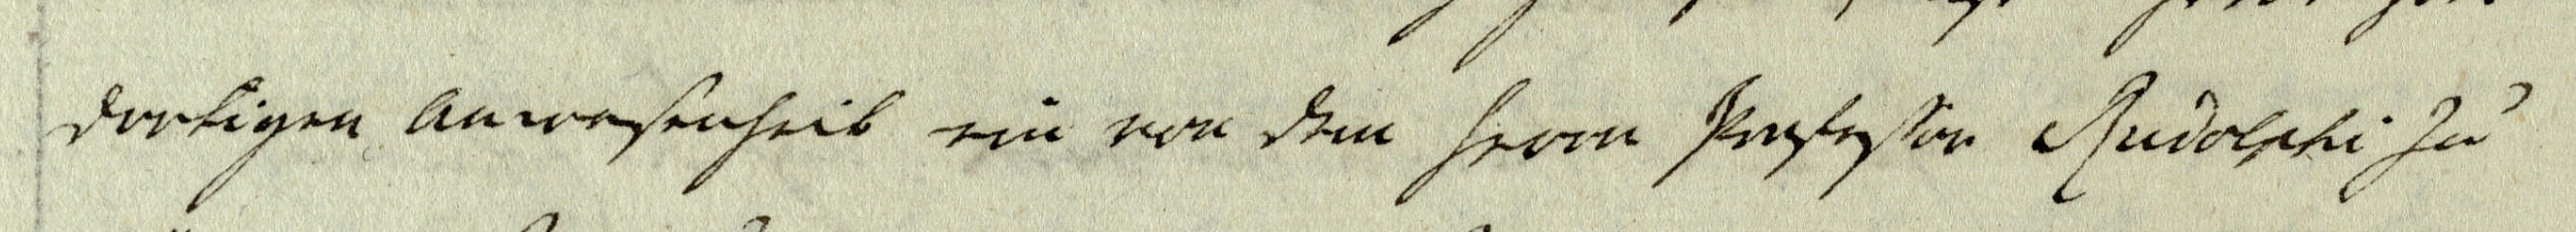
dortigen Anwesenheit ein von dem Herrn Professor Rudolphi zu
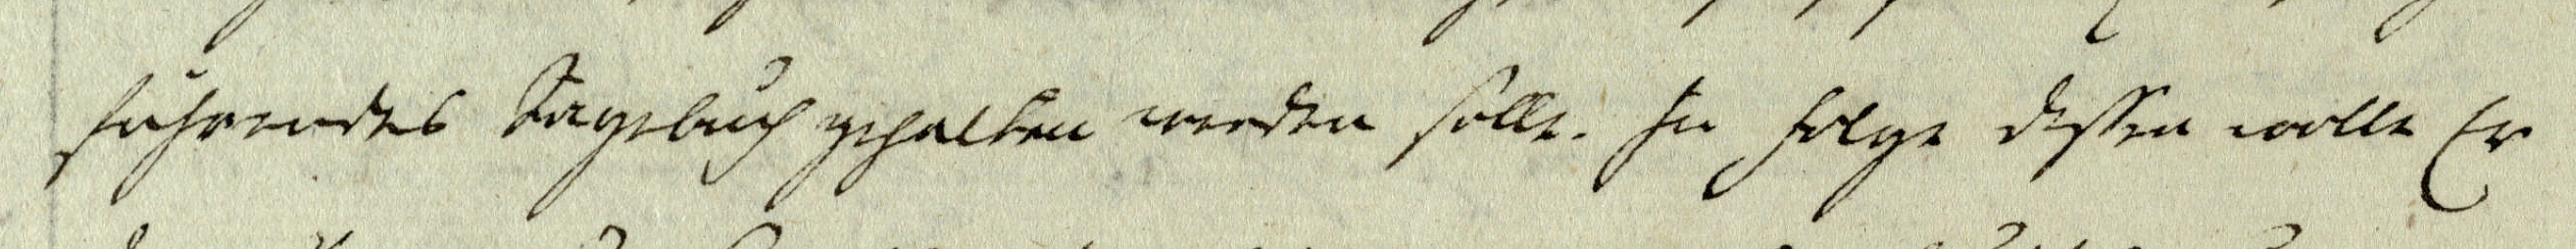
führendes Tagebuch gehalten werden solle. In Folge dessen wolle Er
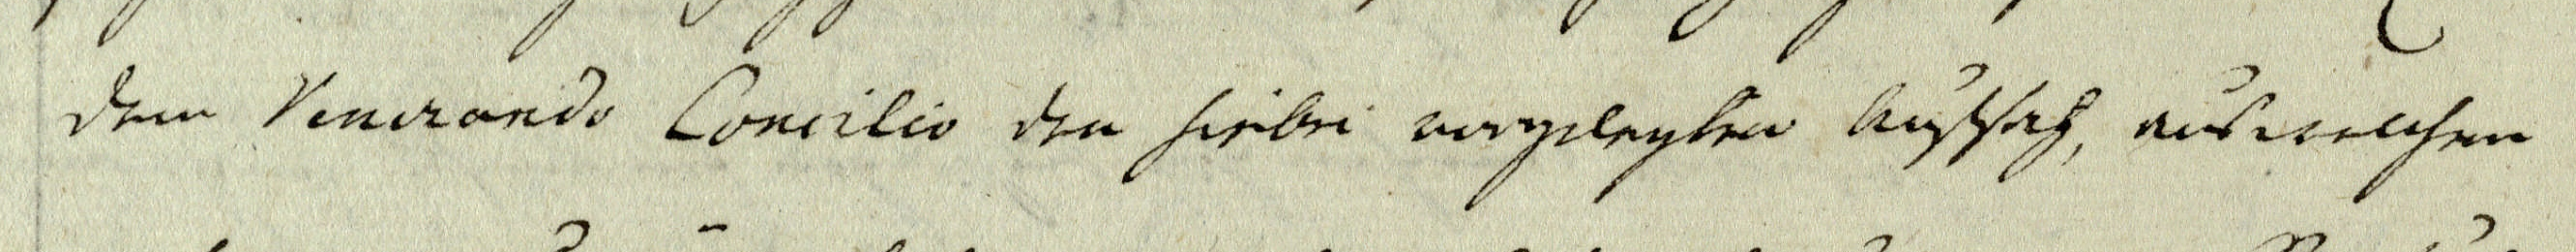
dem Venerando Concilio den hiebei vorgelegten Aufsatz, aus welchem
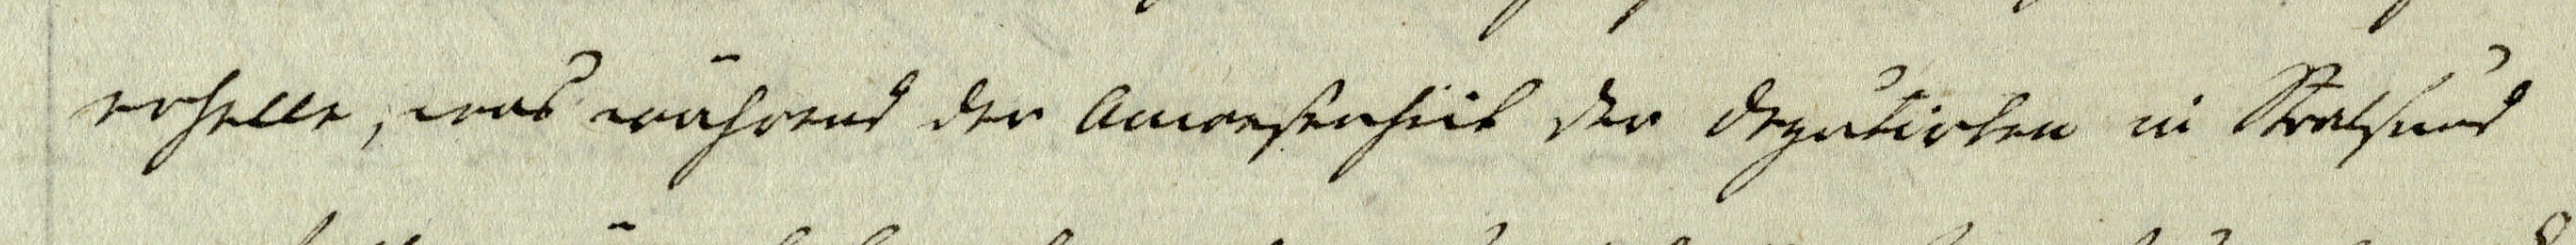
erhelle, was während der Anwesenheit der Deputirten in Stralsund
